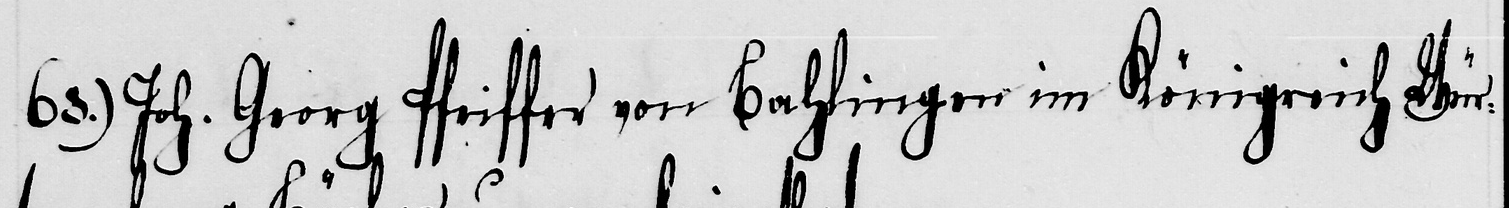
68.) Joh. Georg Pfeiffer von Bahlingen im Königreich Wür¬
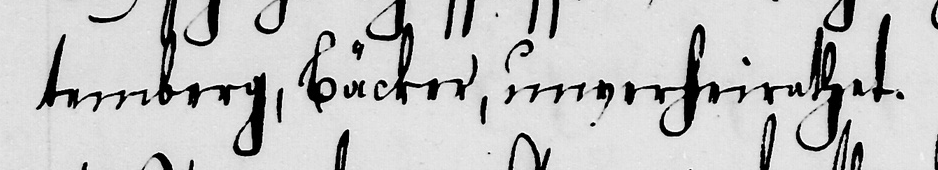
temberg, Bäcker, unverheirathet.
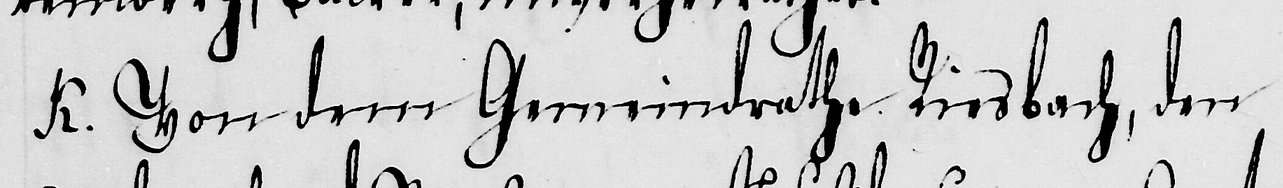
L. Von dem Gemeindrath Seebach, dem
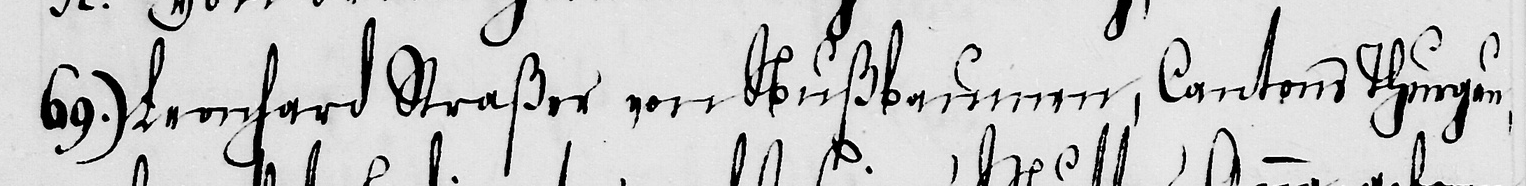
69.) Leonhard Straßer von Nußbaumen, Cantons Thurgau,
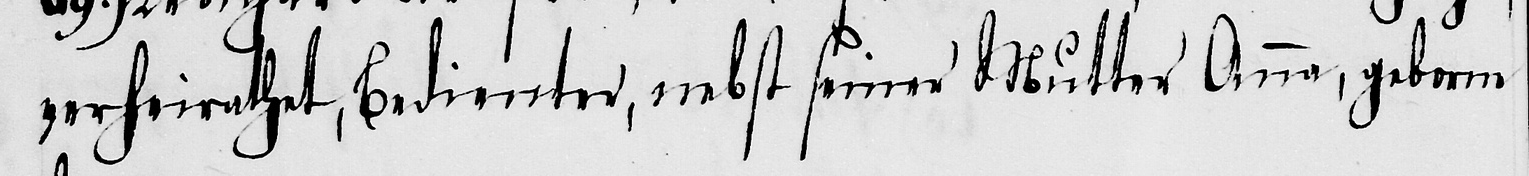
verheirathet, Bedienter, nebst seiner Mutter Anna, geborne
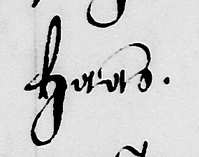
Haas.
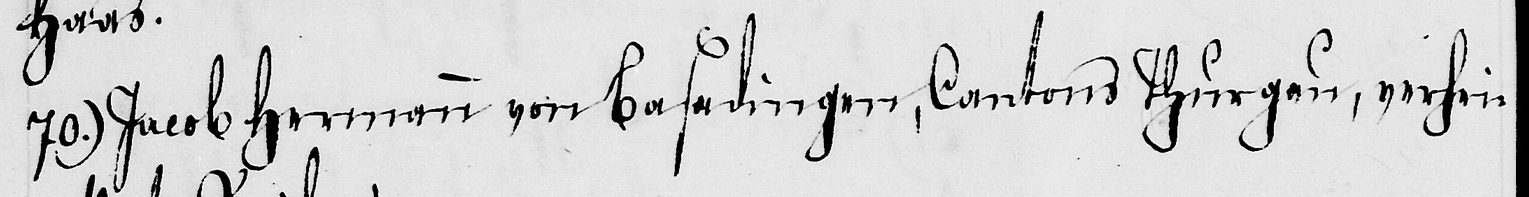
70.) Jacob Hermann von Basadingen, Cantons Thurgau, verhei¬
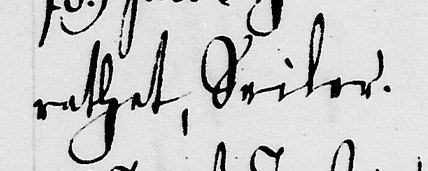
rathet, Seiler.
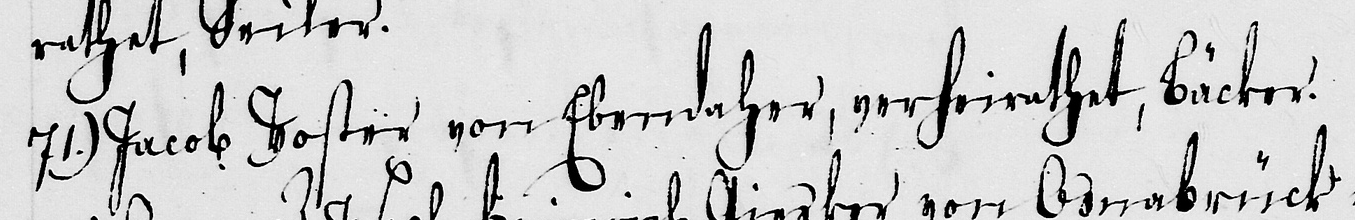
71.) Jacob Voster von Ebendaher, verheirathet, Bäcker.
